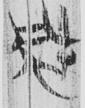風
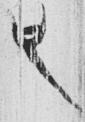也
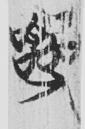○（亂）
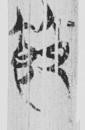節
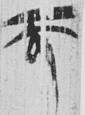而
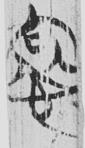○（哀）
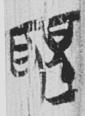聖（聲）
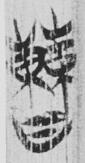曹
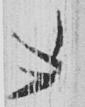之
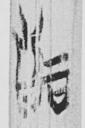喪
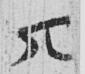亓（其）
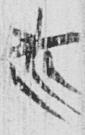必
